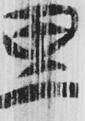里
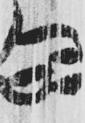含（今）
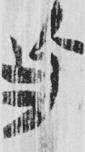此
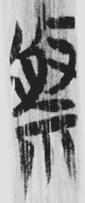祭
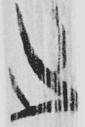之
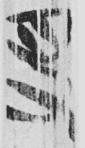○（得）
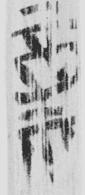福
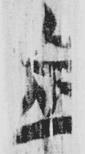者
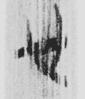也
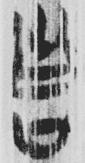青（請）
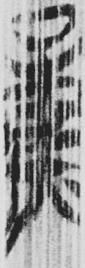量
